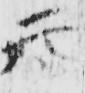亓（其）
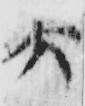大
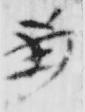市
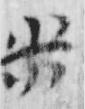米
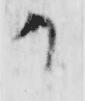人
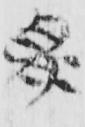{胃刀}（謂）
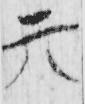亓
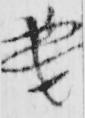弟
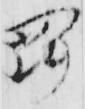芻
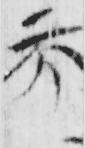而
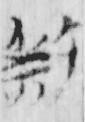殺
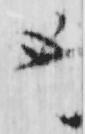之
